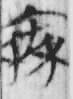秦
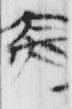赤
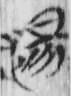湯
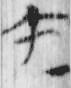午
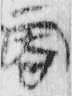丙
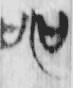申
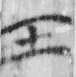壬
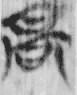晨
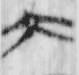大
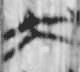大
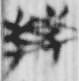登
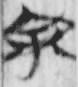余
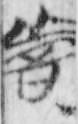善
